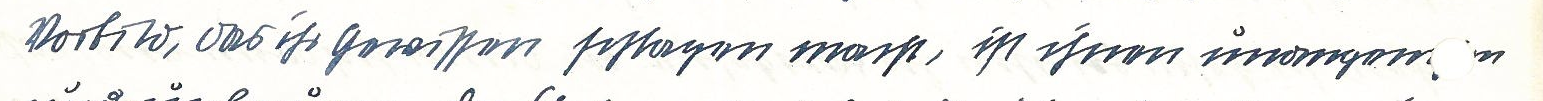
Vorbild, das ihr Gewissen schlagen macht, ist ihnen unangen
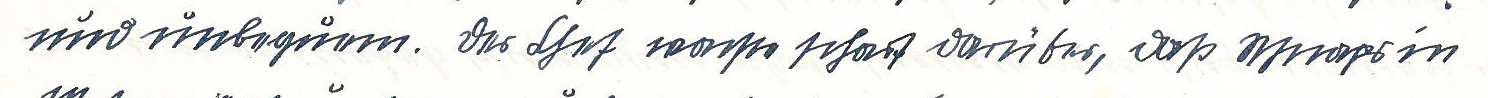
und unbequem. Der Chef wachte scharf darüber, daß Schnaps in
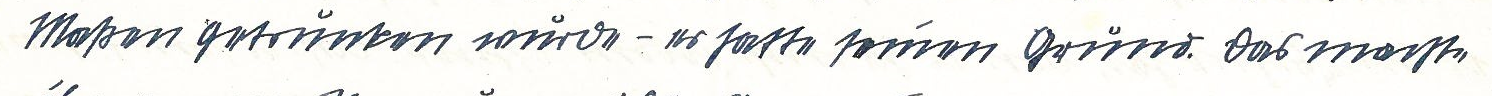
Maßen getrunken wurde – es hatte seinen Grund. Das machte
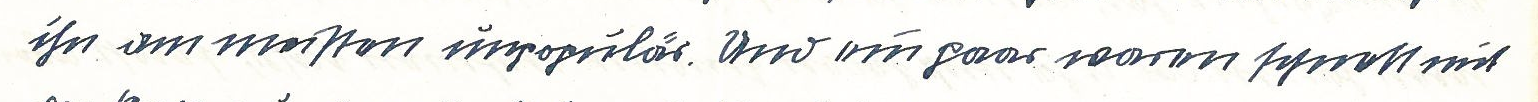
ihn am meisten unpopulär. Und ein paar waren schnell mit
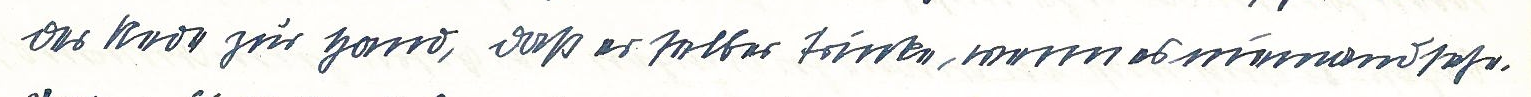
der Rede zur Hand, daß er selber trinke, wenn es niemand sehe.
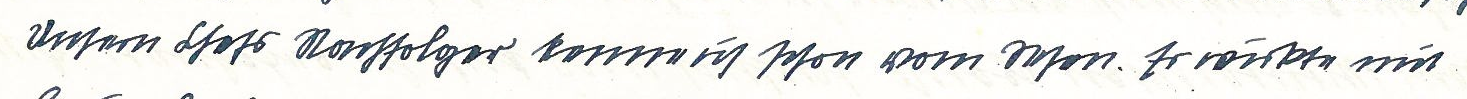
Unsern Chef Nachfolger kenne ich schon vom Sehen. Er wirkte mit
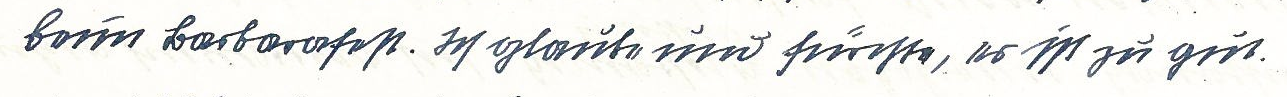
beim Barbarafest. Ich glaube und fürchte, er ist zu gut.
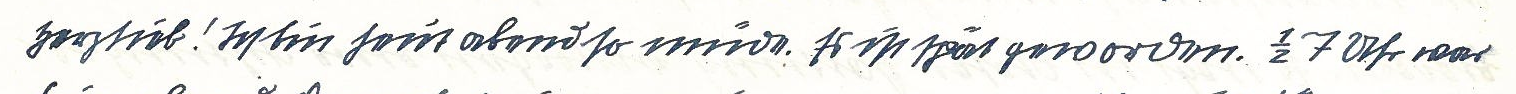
Herzlieb! Ich bin heut abend so müde. Es ist spät geworden. ½ 7 Uhr war
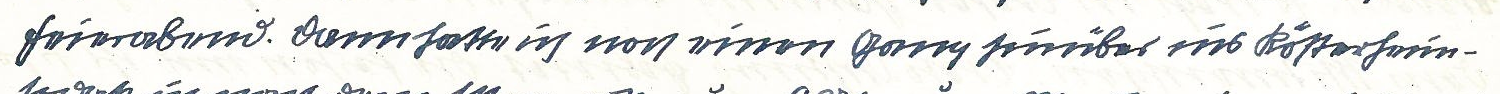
Feierabend. Dann hatte ich noch einen Gang herüber ins Kösterheim –
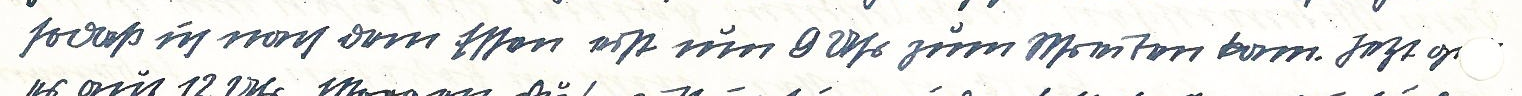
sodaß ich nach dem Essen erst um 9 Uhr zum Schreiben kam. Jetzt ge
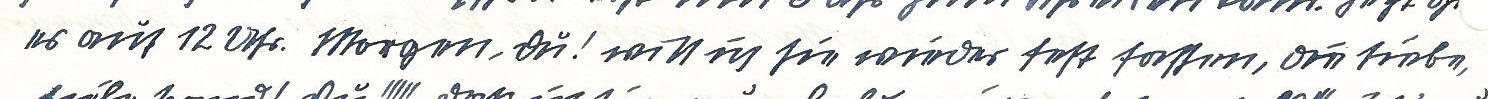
es auf 12 Uhr. Morgen, Du!!!!! will ich sie wieder fest forffen, Die siebe
